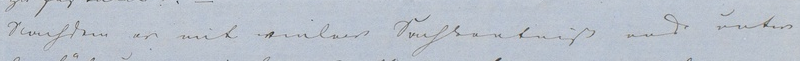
Nachdem er mit vieler Sachkentniß und unter
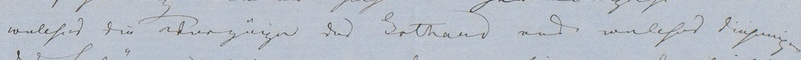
welches die Vorzüge des Gothard und welche diejenigen
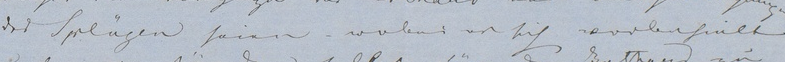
des Splügen seien – wobei er sich vorbehielt
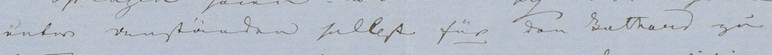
unter Umständen selbst für den Gothard zu
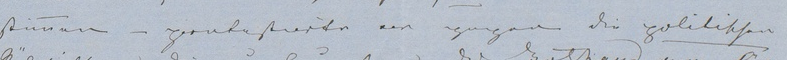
stimmen – protestirte er gegen die politischen
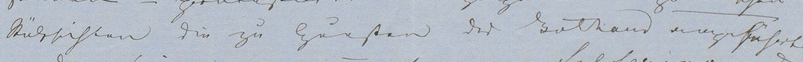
Rüksichten die zu Gunsten des Gothard angeführt
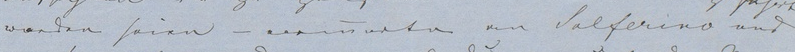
worden seien – erinnerte an Solferino und
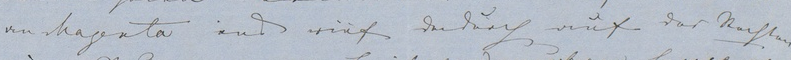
an Magenta und rief dadurch auf der Rechten
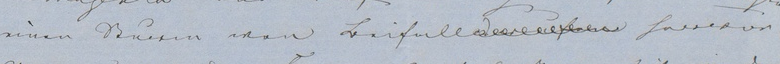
einen Sturm von Beifalls... hervor.
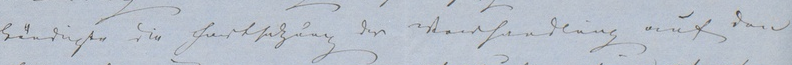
kündigte die Fortsetzung der Verhandlung auf den
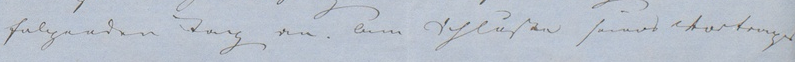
folgenden Tag an. Am Schluße seines Vortrags
